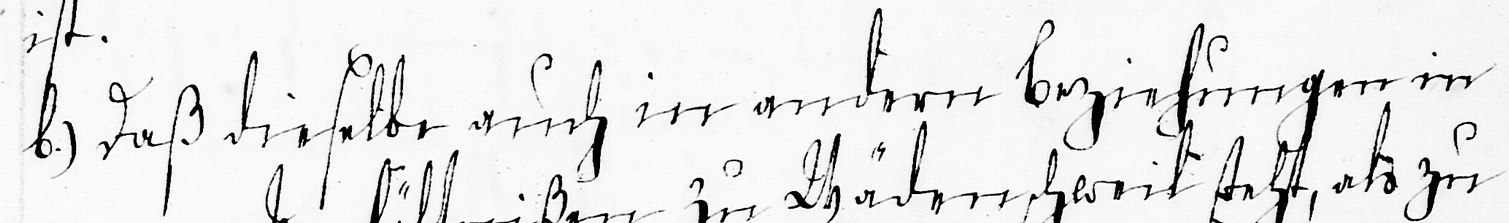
b.) Daß dieselbe auch in andern Beziehungen in
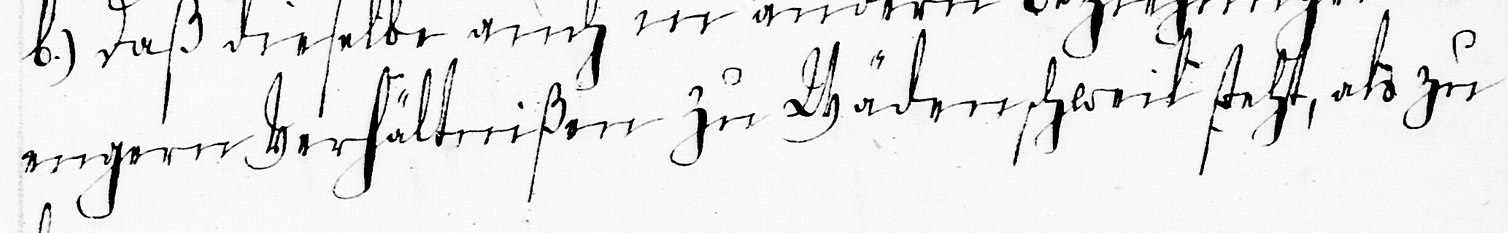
engern Verhältnißen zu Wädenschweil steht, als zu
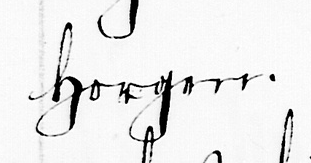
Horgen.
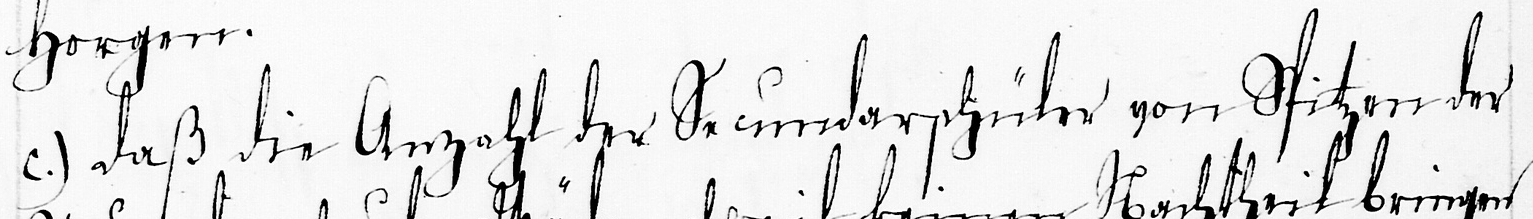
c.) daß die Anzahl der Secundarschüler von Spitzen der
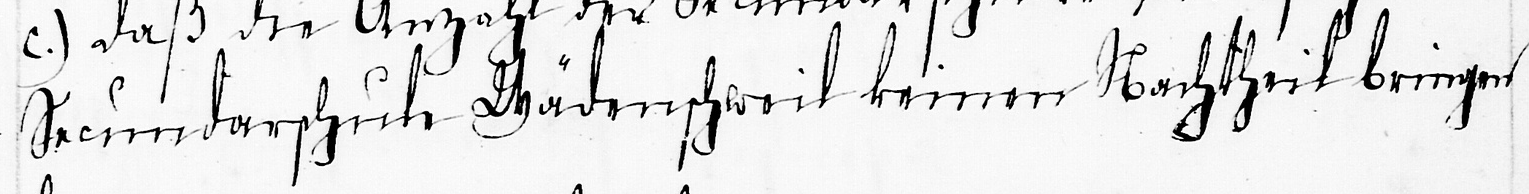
Secundarschule Wädenschweil keinen Nachtheil bringen
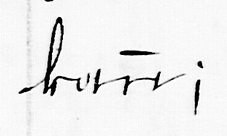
kann;
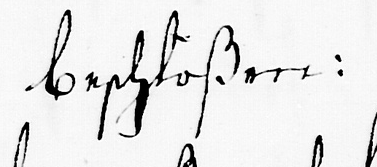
beschloßen:
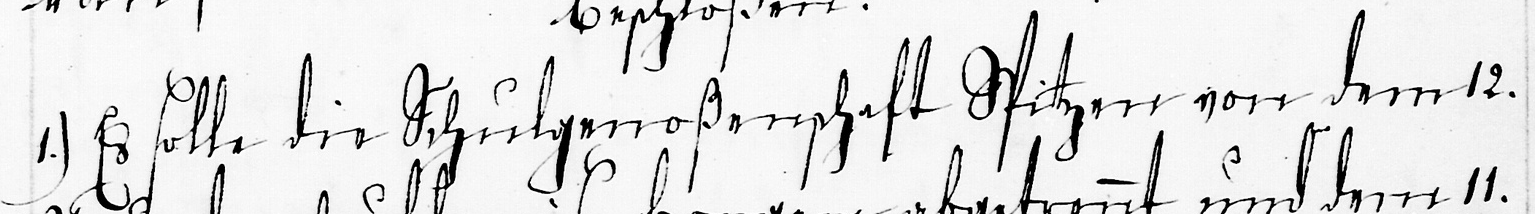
Es solle die Schulgenoßenschaft Spitzen von dem 12.
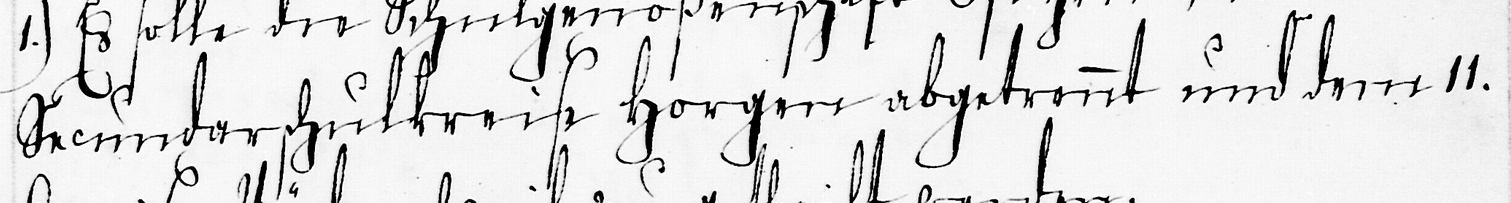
Secundarschulkreise Horgen abgetrennt und dem 11.
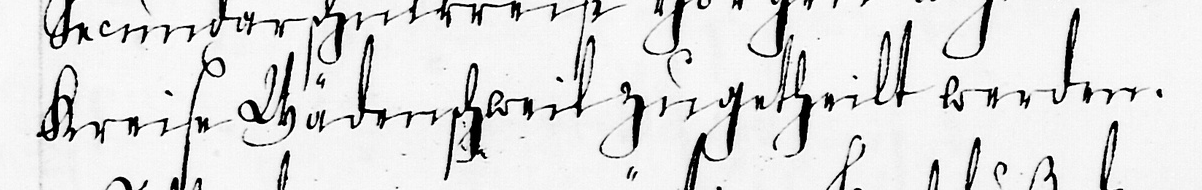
Kreise Wädenschweil zugetheilt werden.
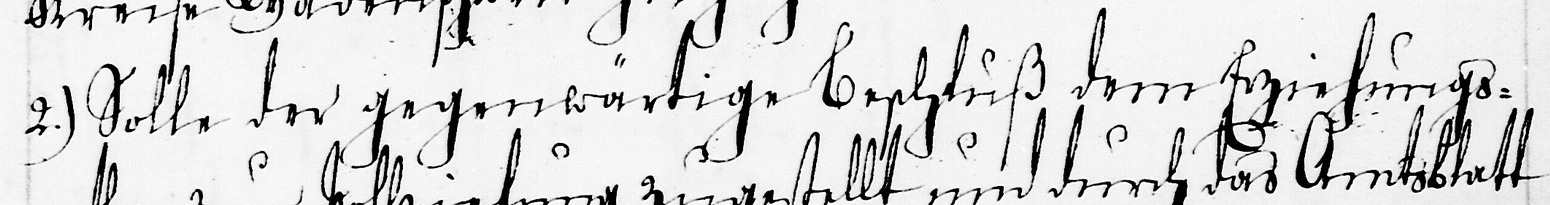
2.) Solle der gegenwärtige Beschluß dem Erziehungs¬
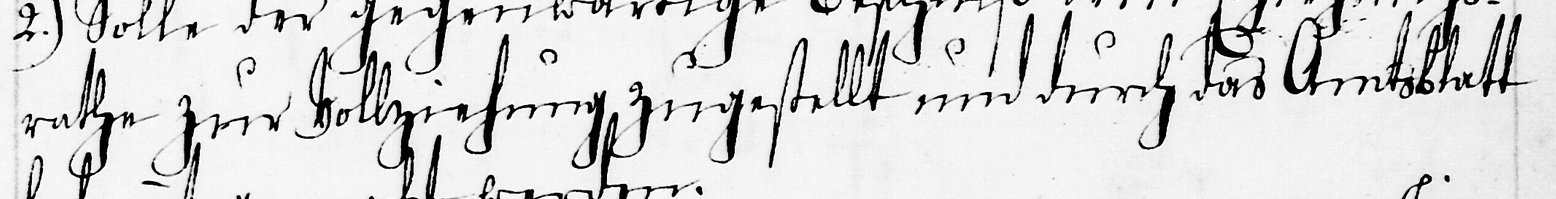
rathe zur Vollziehung zugestellt und durch das Amtsblatt
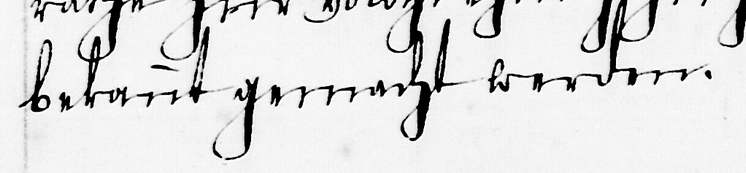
bekannt gemacht werden.
